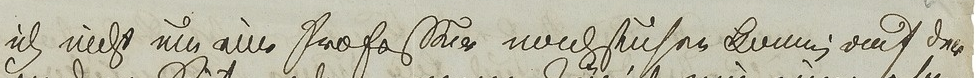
ich nicht um eine Professur nachsuchen kam, auf der
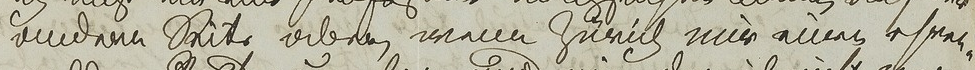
andern Seite aber, wenn Zürich mir einen ehren-
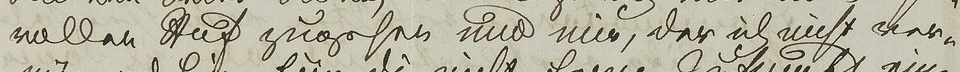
vollen Ruf zugehen und mir, der ich nicht ver-
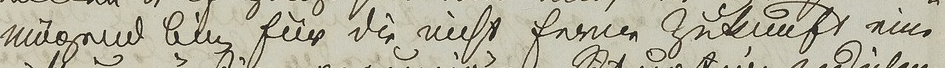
mögend bin, für die nicht ferne Zukunft eine
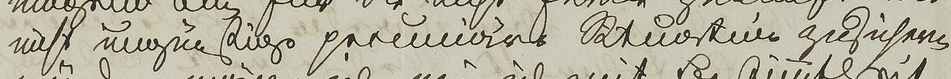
nicht ungünstige pecuniäre Situation zusichern
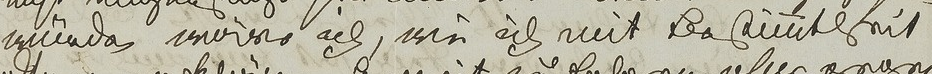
würde, wäre ich, wie ich mit Bestimmtheit
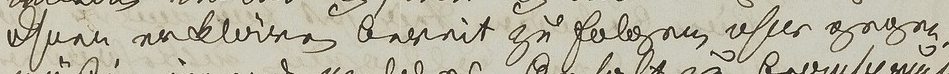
Ihnen erkläre, bereit zu folgen, ohne gegen-
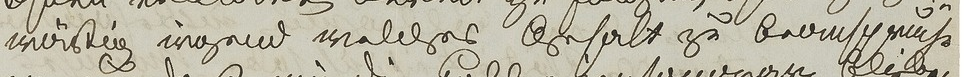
wärtig irgend welches Gehalt zu beanspruch-
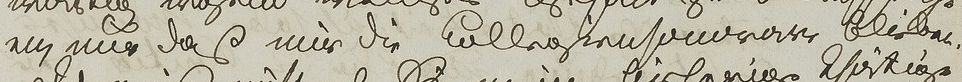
en, nur daß mir die Collegienhonorare bleiben.
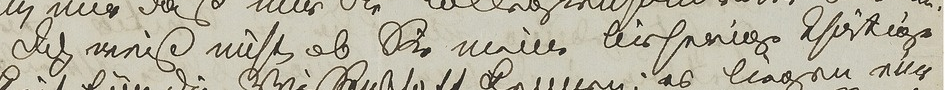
Ich weiß nicht, ob Sie meine bisherige Thätig-
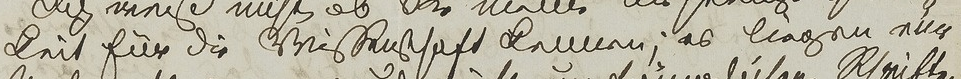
keit für die Wissenschaft kennen; es liegen eine
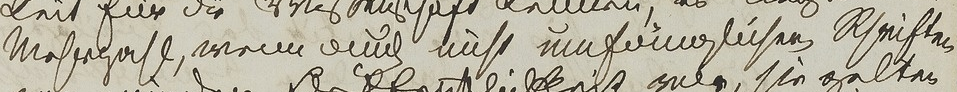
Mehrzahl, wenn auch nicht umfänglicher Schriften
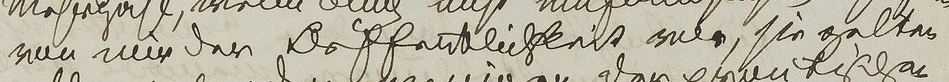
von mir der Oeffentlichkeit vor, sie gelten
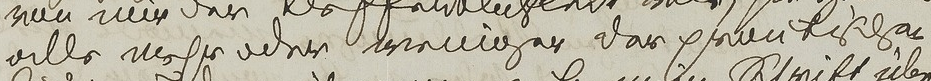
alle mehr oder weniger der practischen
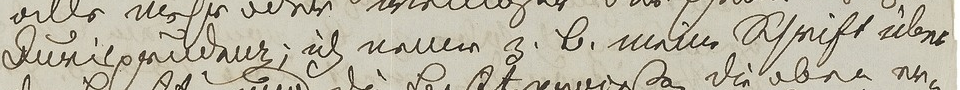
Jurisprudenz; ich nenne z. B. meine Schrift über
